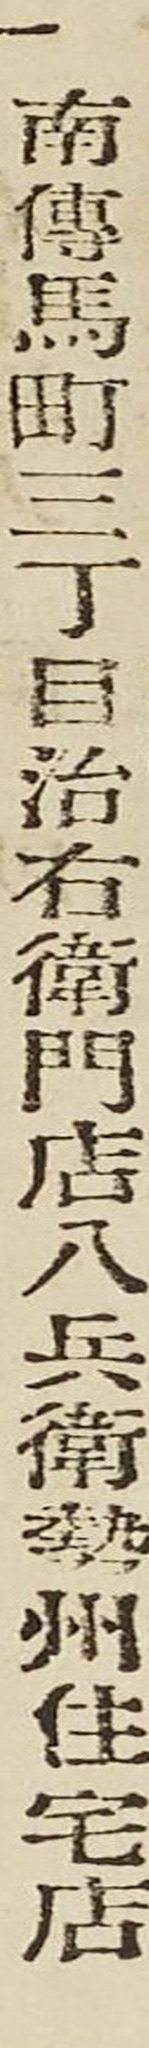一南伝馬町三丁目治右衛門店八兵衛勢州住宅店
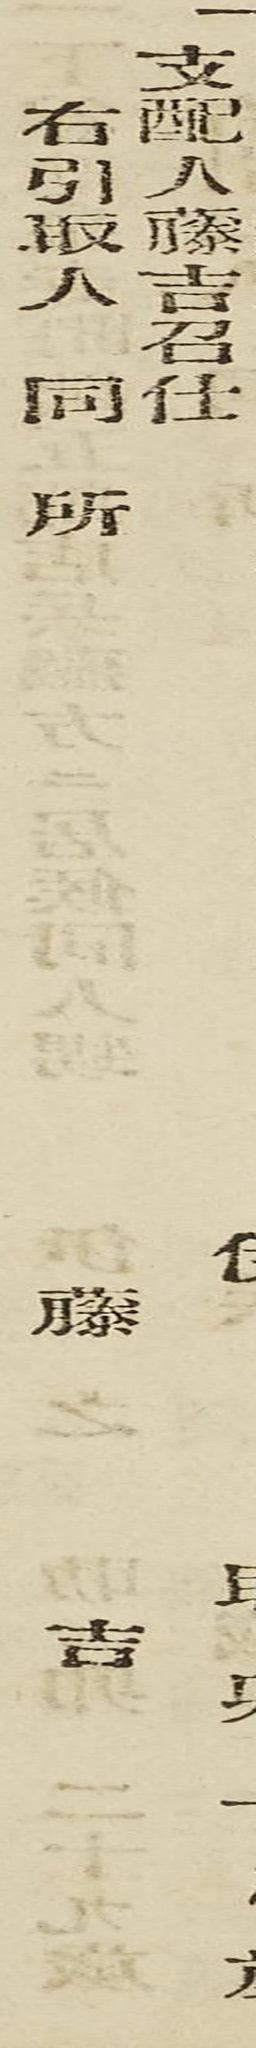右引取人同所藤吉
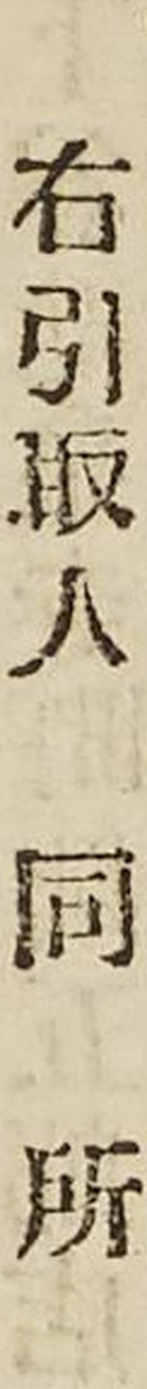右引取人同同
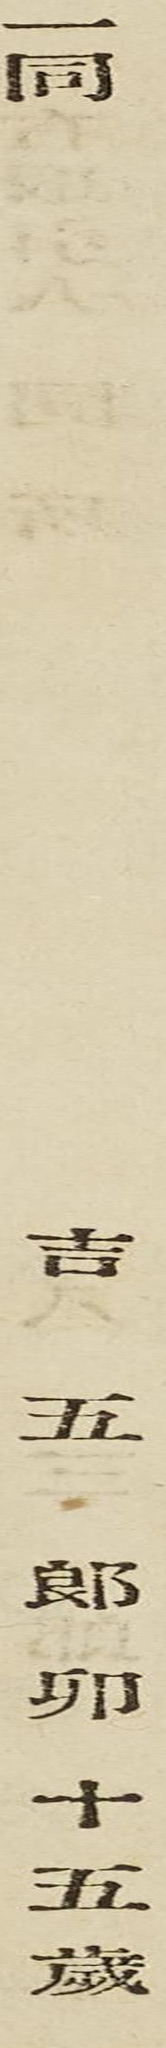一同吉五郎卯十五歳
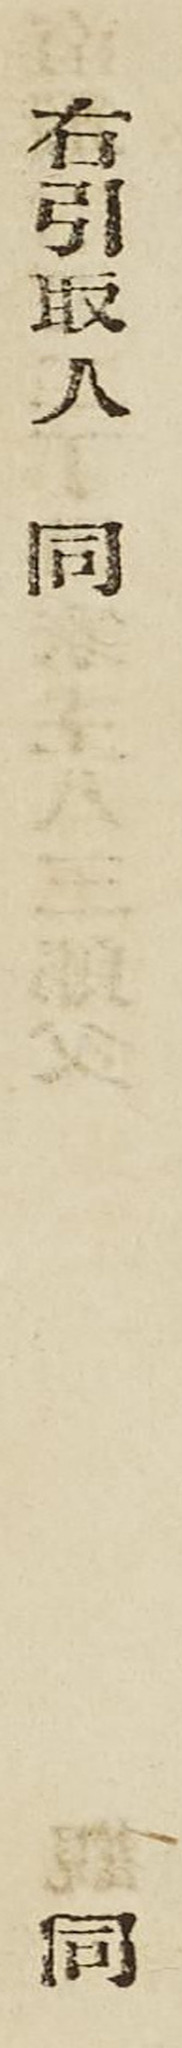右引取人同同
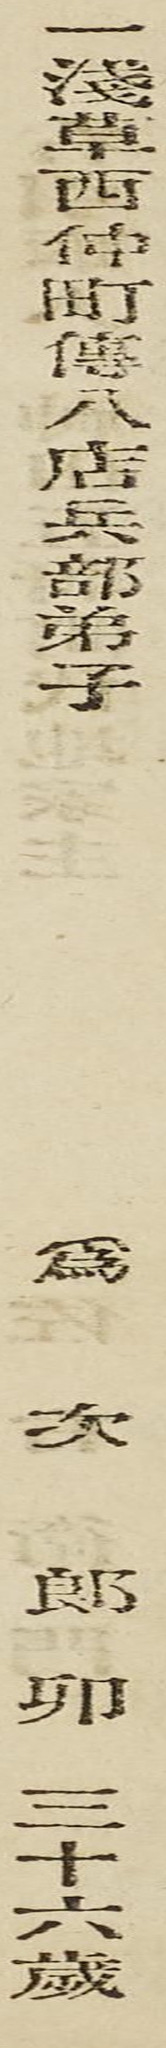一浅草西仲町傳八店兵部弟子為次郎卯三十六歳
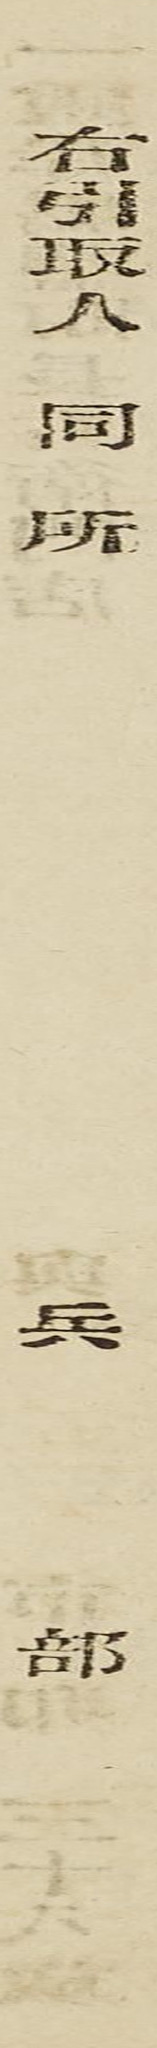右引取人同所兵部
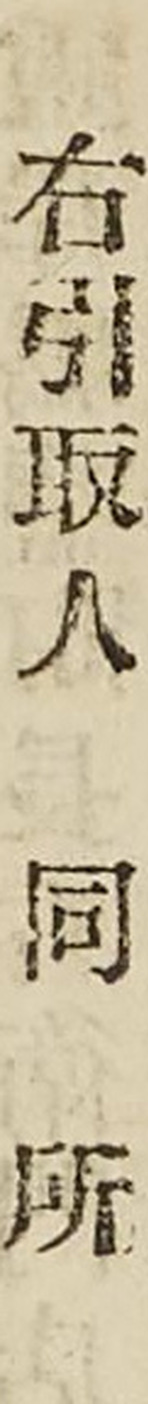右引取人同同
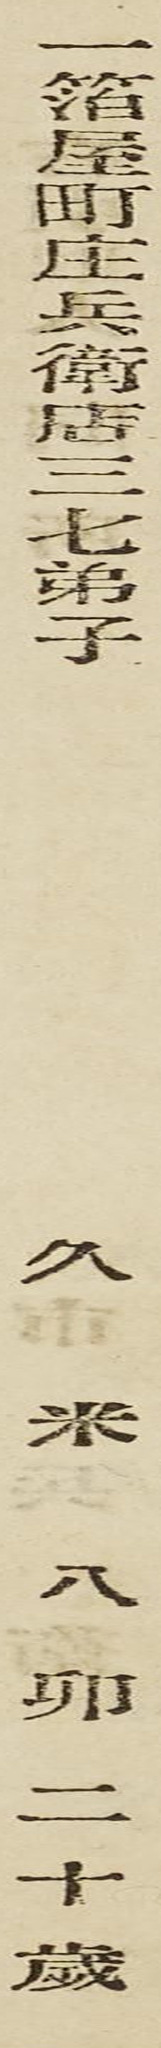一箔屋町庄兵衛店三七弟子久米八卯二十歳
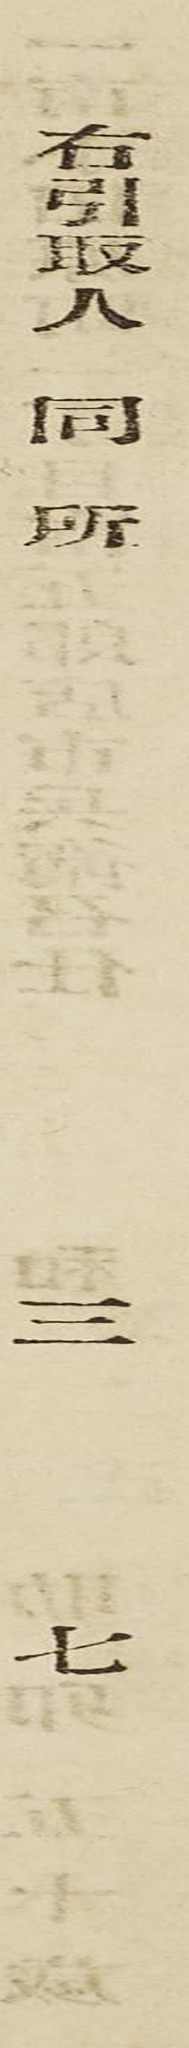右引取人同所三七
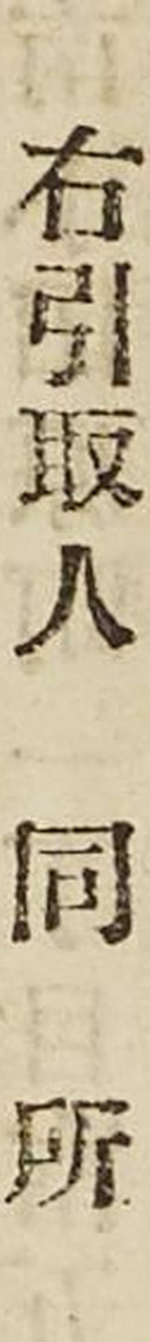右引取人同同
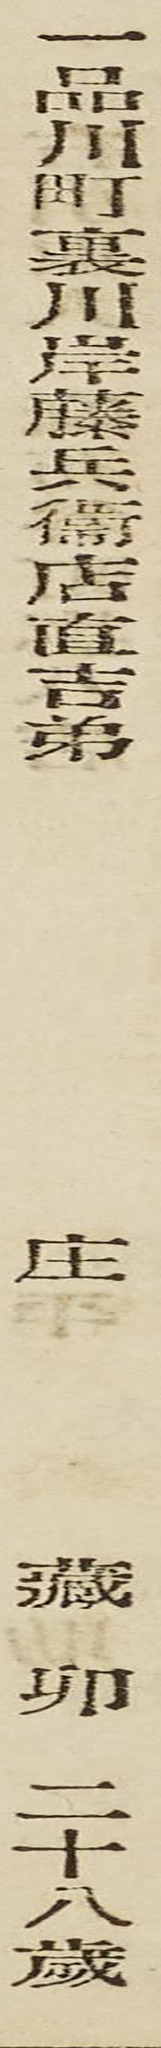一品川町裏川岸藤兵衛店直吉弟庄蔵卯二十八歳
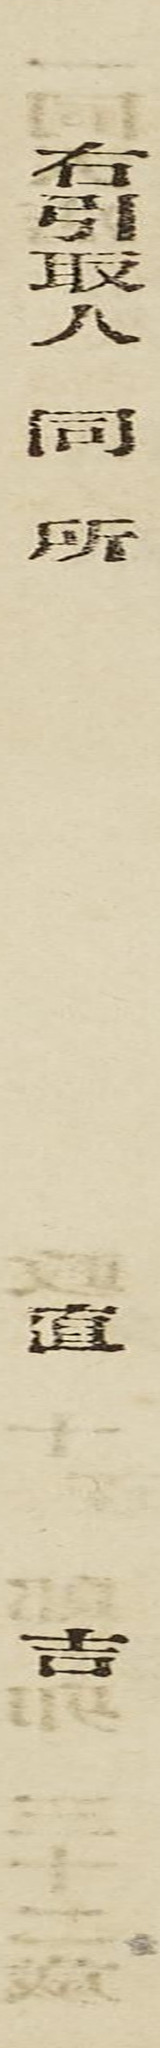右引取人同所直吉
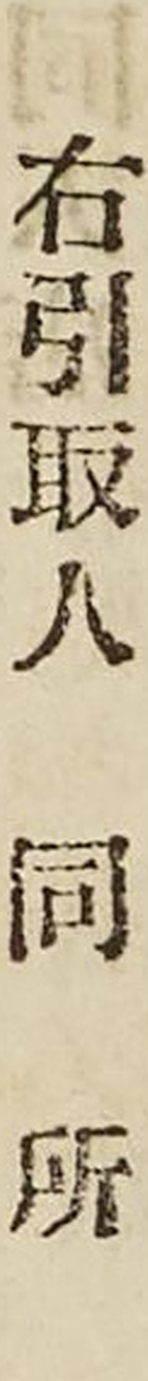右引取人同同
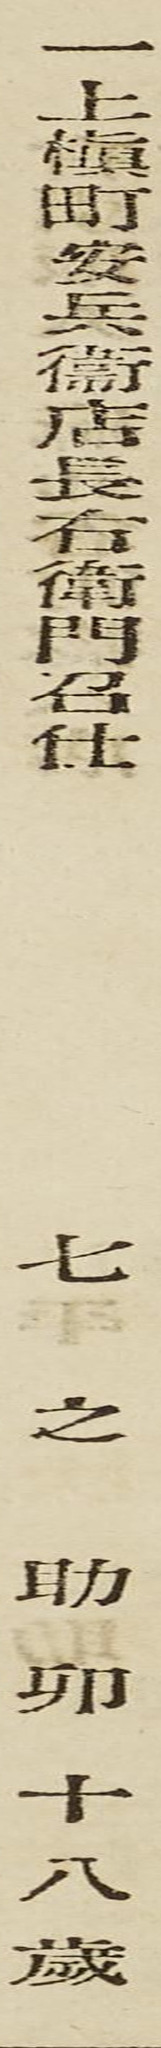一上槇町安兵衛店長右衛門召仕七之助卯十八歳
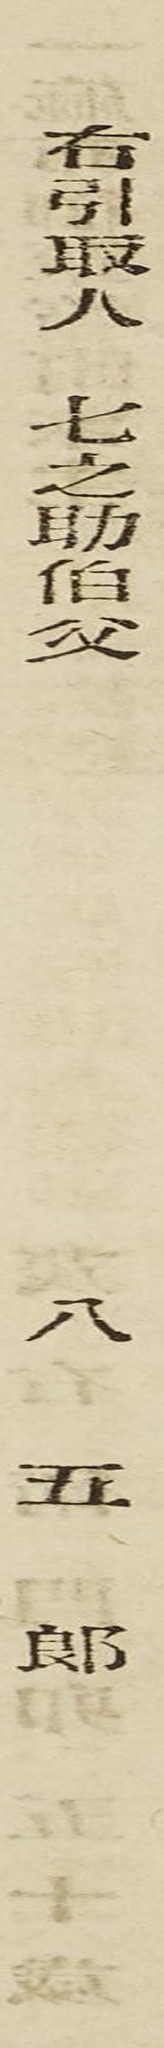右引取人七之助伯父八五郎
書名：永代惨話　文化の夢　全
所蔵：東京大学地震研究所図書室 Earthquake Research Institute Library, The University of Tokyo, JAPAN
